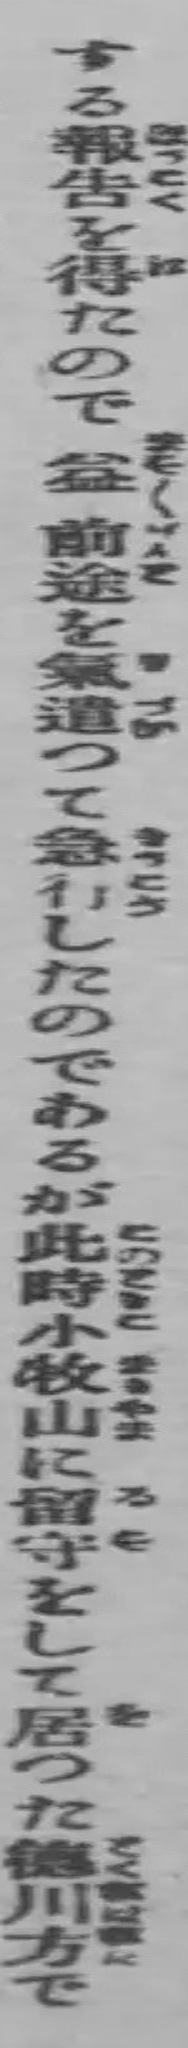する報告を得たので益前途を気遣つて急行したのであるが此時小牧山に留守をして居つた徳川方で
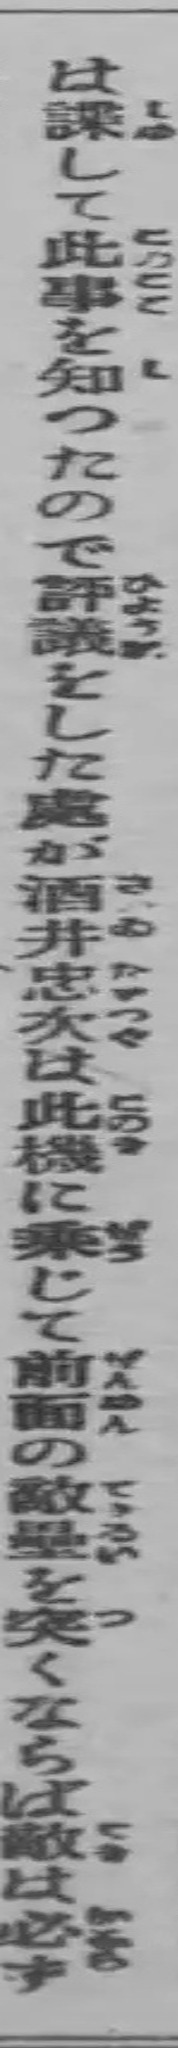は諜して此事を知つたので評議をした処が酒井忠次は此機に乗じて前面の敵塁を突くならば敵は必ず
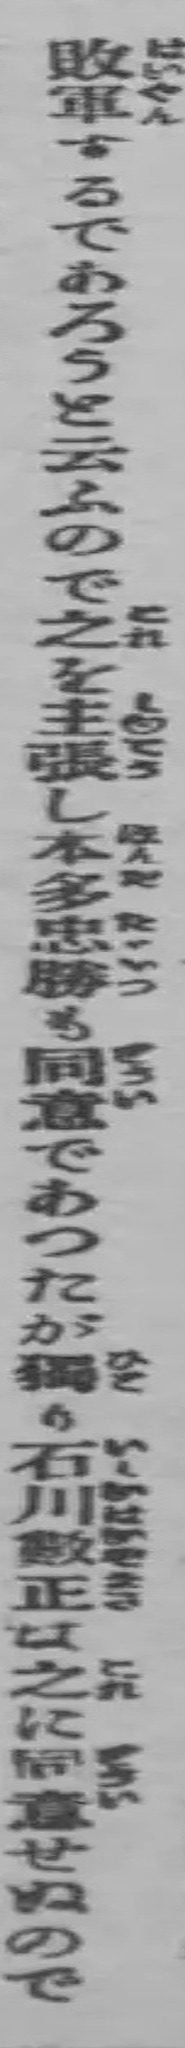敗軍するであろうと云ふので之を主張し本多忠勝も同意であつたが独り石川数正は之に同意せぬので
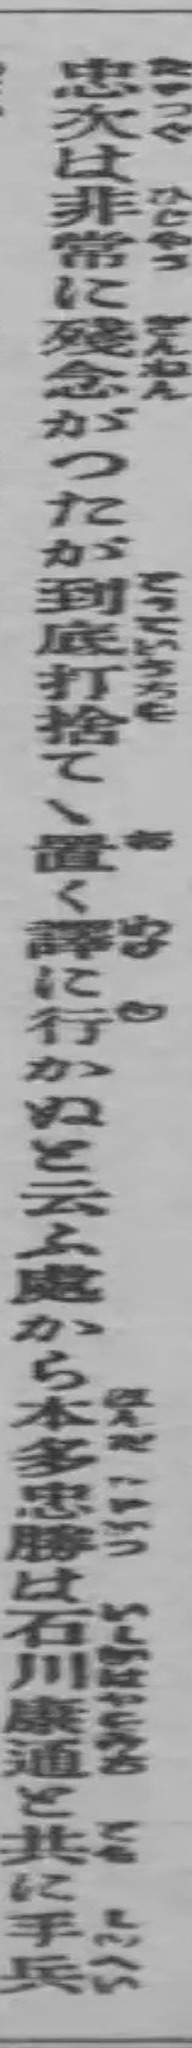忠次は非常に残念がつたが到底打捨てゝ置く訳に行かぬと云ふ処から本多忠勝は石川康通と共に手兵
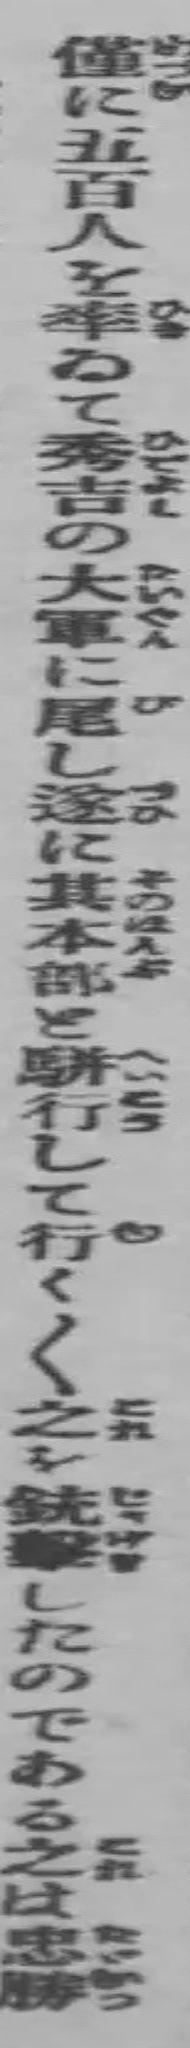僅に五百人を率ゐて秀吉の大軍に尾し遂に其本部と駢行して行く〳〵之を銃撃したのである之は忠勝
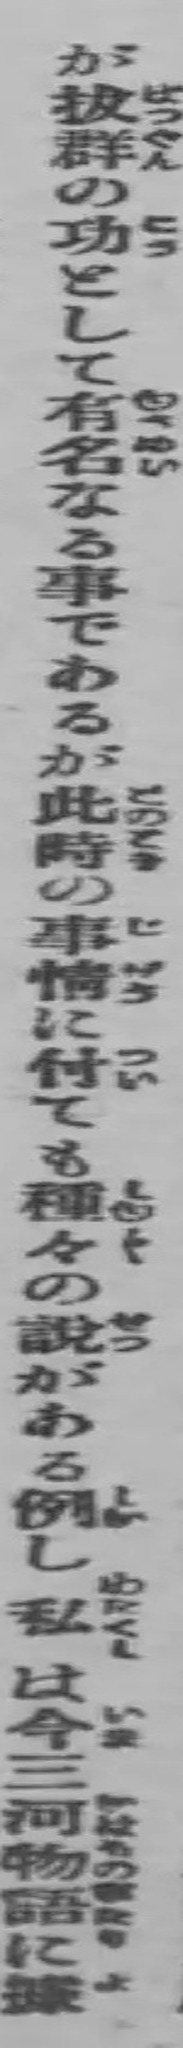が抜群の功として有名なる事であるが此時の事情に付ても種々の説がある例私は今三河物語に拠
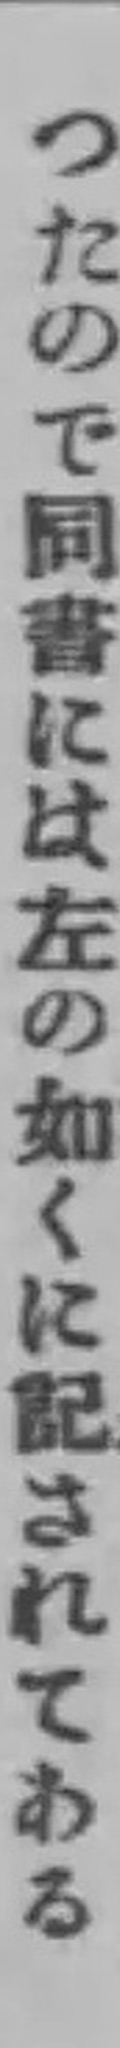つたので同書には左の如くに記されてある
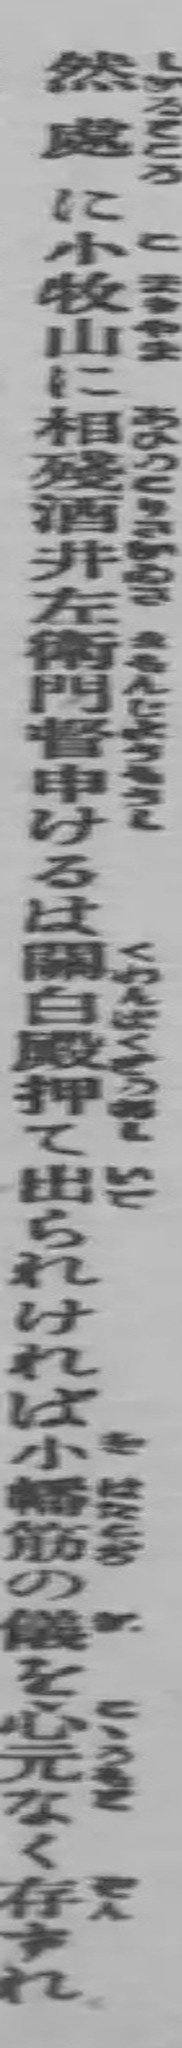然処に小牧山に相残酒井左衛門尉申けるは関白殿押て出られければ小幡筋の儀を心元なく存ずれ
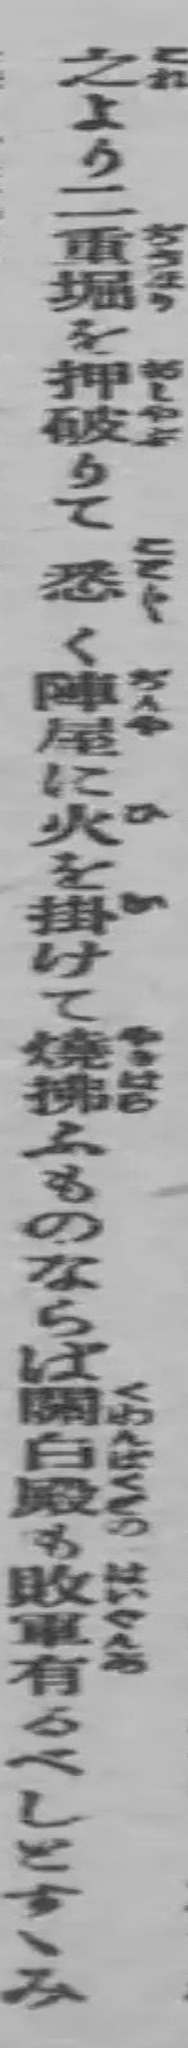之より二重堀を押破りて悉く陣屋に火を掛けて焼払ふものならば関白殿も敗軍有るべしとすゝみ
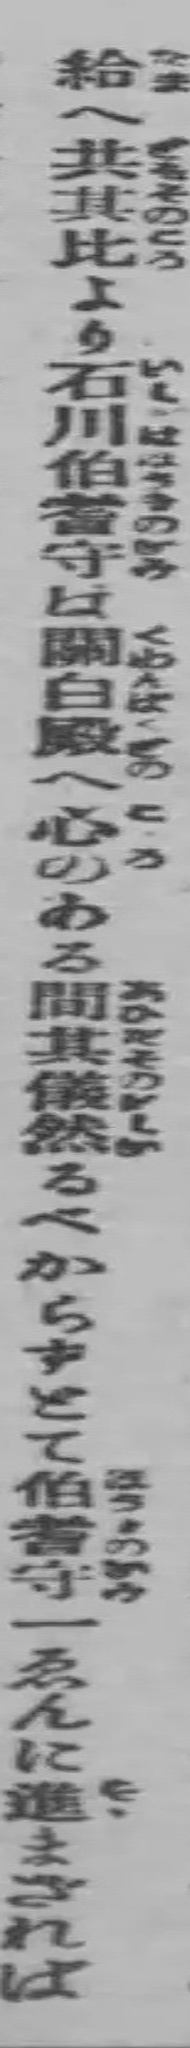給へ共其比より石川伯耆守は関白殿へ心のある間其儀然るべからずとて伯耆守一ゑんに進まざれば
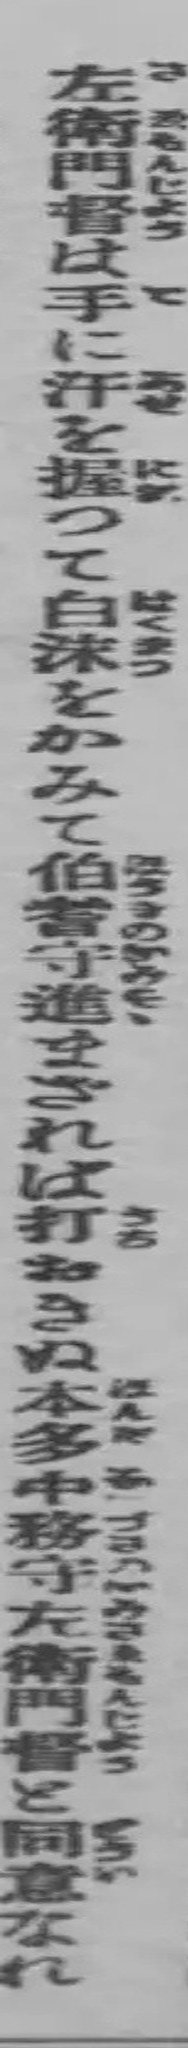左衛門尉は手に汗を握つて白沫をかみて伯耆守進まざれば打おきぬ本多中務守左衛門尉と同意なれ
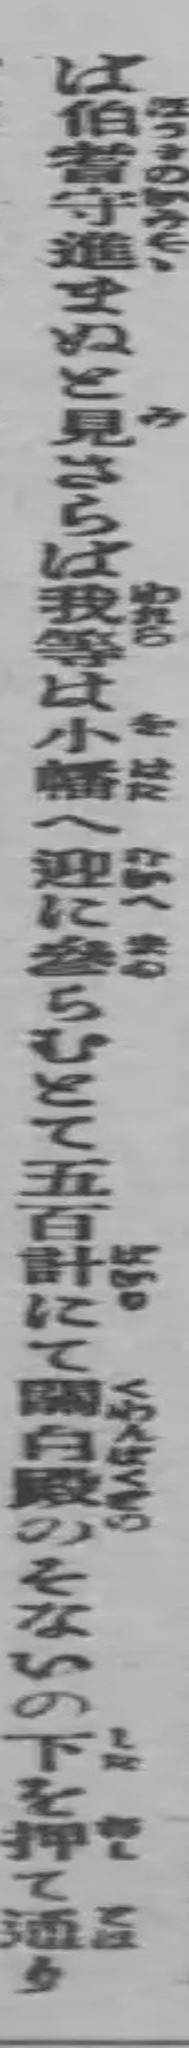ば伯耆守進まぬと見さらば我等は小幡へ迎に参らむと五百計にて関白殿のそないの下を推て通り
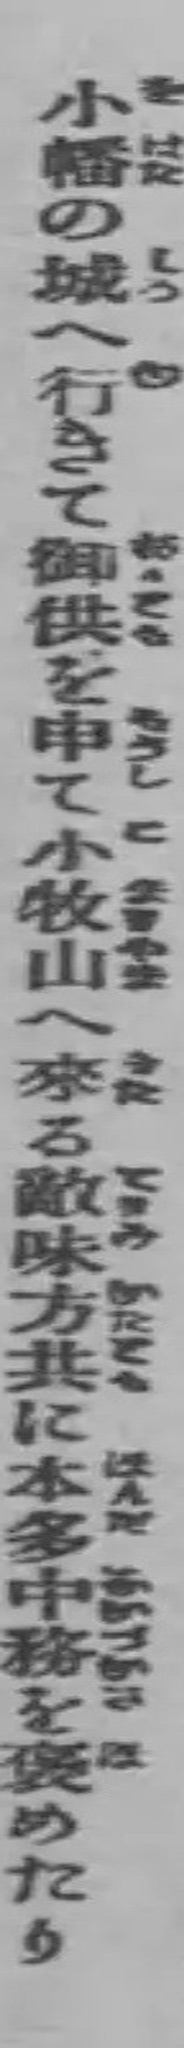小幡の城へ行きて御供を申て小牧山へ来る敵味方共に本多中務を褒めたり

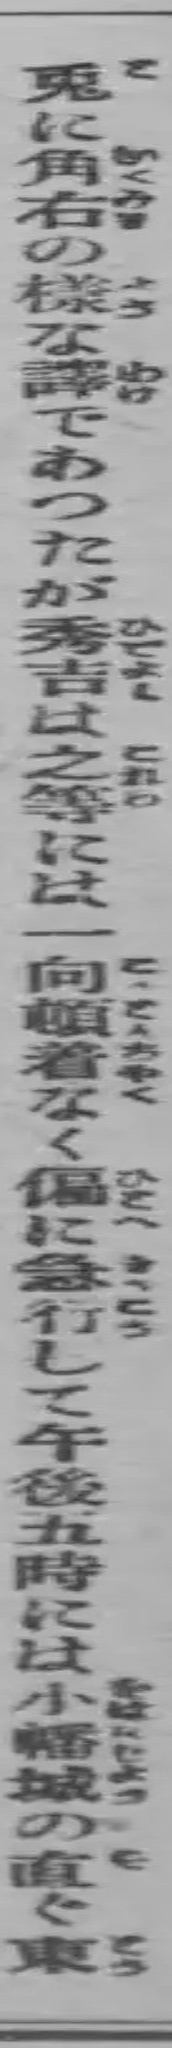兎に角右の様な訳であつたが秀吉は之等には一向頓着なく偏に急行して午後五時には小幡城の直ぐ東
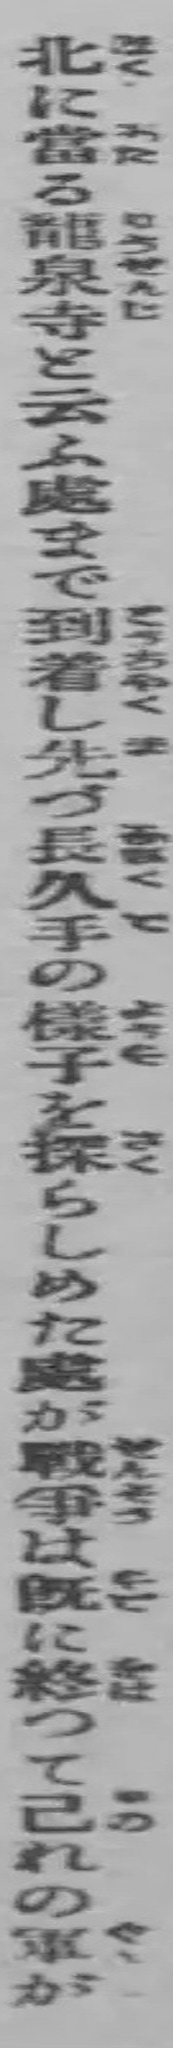北に当る龍泉寺と云ふ処まで到着し先づ長久手の様子を探らしめた処が戦争は既に終つて己れの軍が
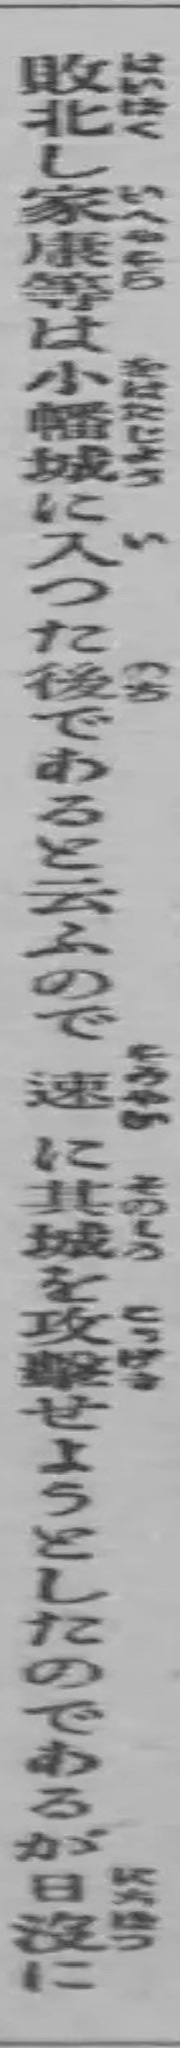敗北し家康等は小幡城に入つた後であると云ふので速に其城を攻撃せようとしたのであるが日没に
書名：豊橋市史談
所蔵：国立国会図書館 National Diet Library, JAPAN
